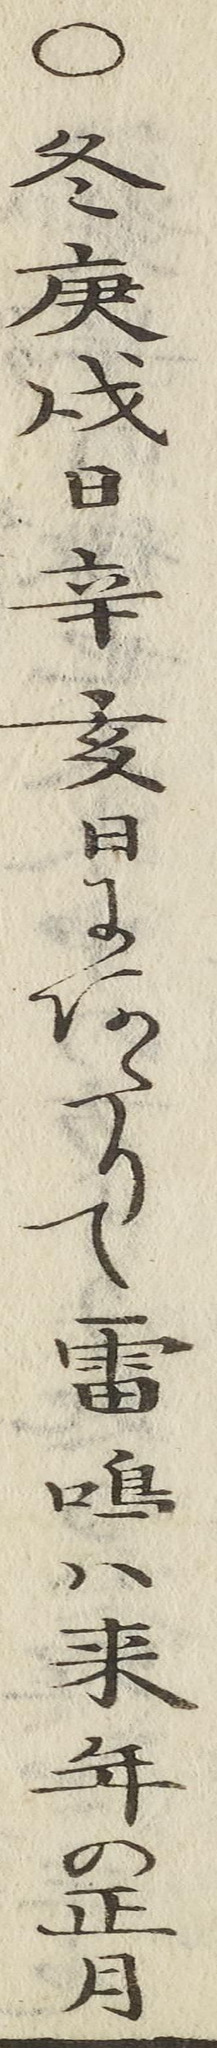○冬庚戌日辛亥日にあたりて雷鳴は来年の正月
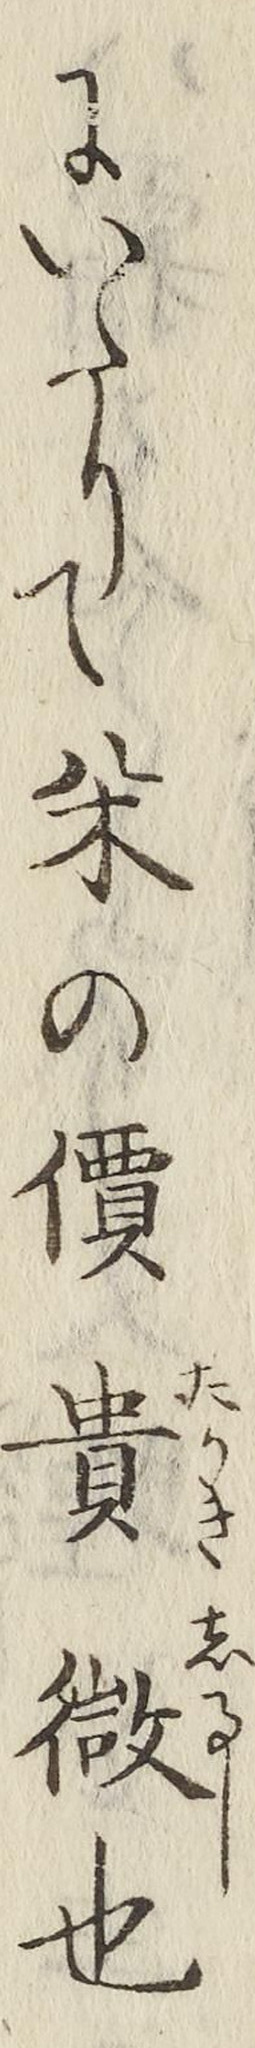にいたりて米の価貴徴也
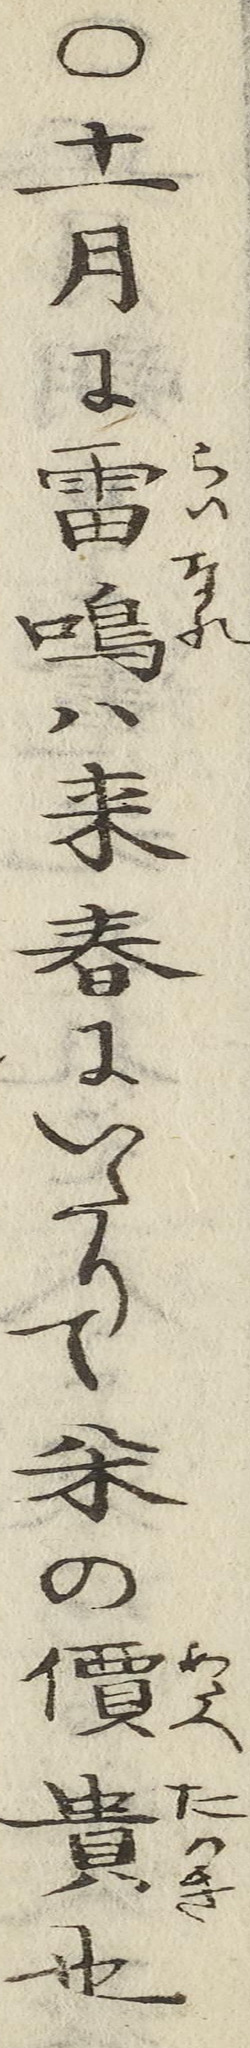○十一月に雷鳴は来春にいたりて米の価貴也
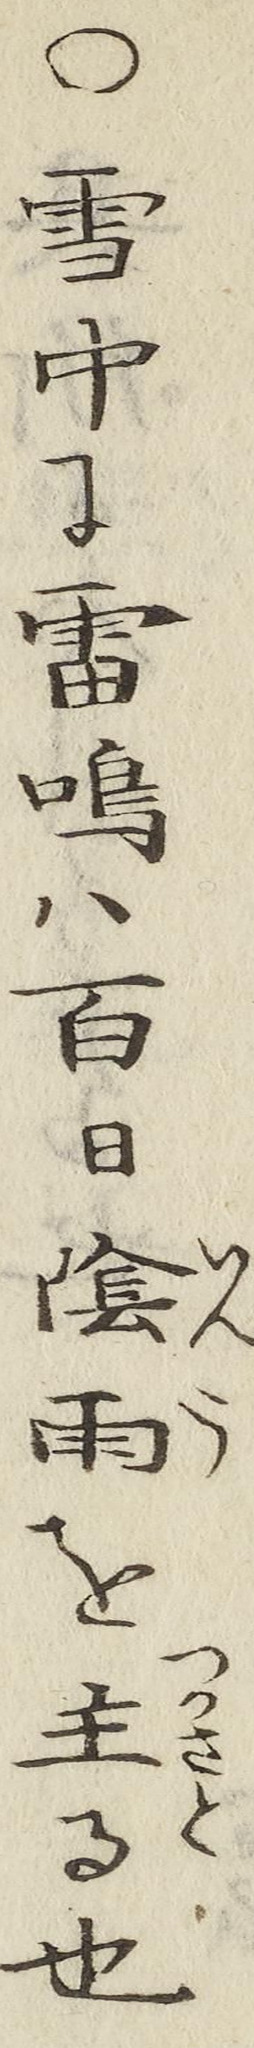○雪中に雷鳴は百日陰雨を主る也
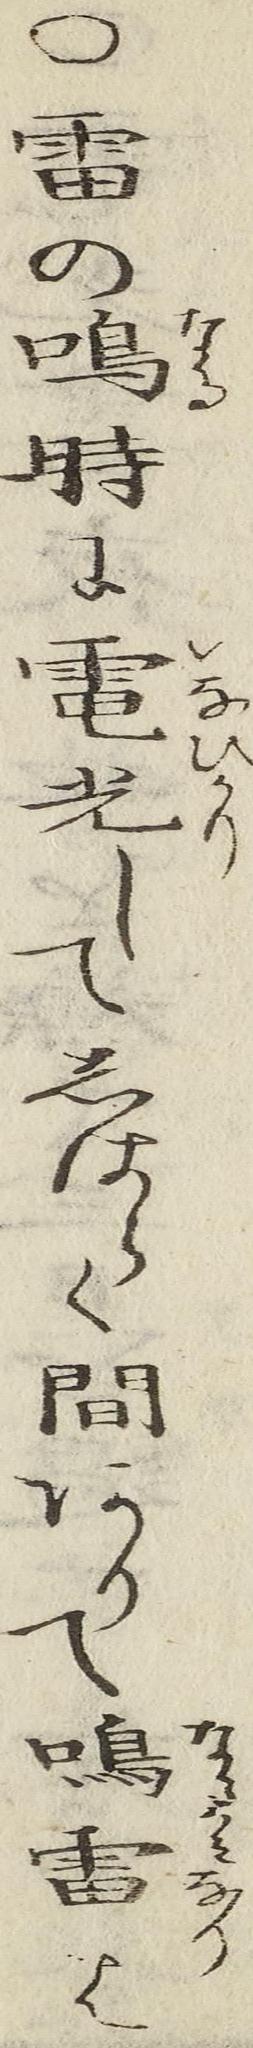○雷の鳴時に電光してしはらく間ありて鳴雷は
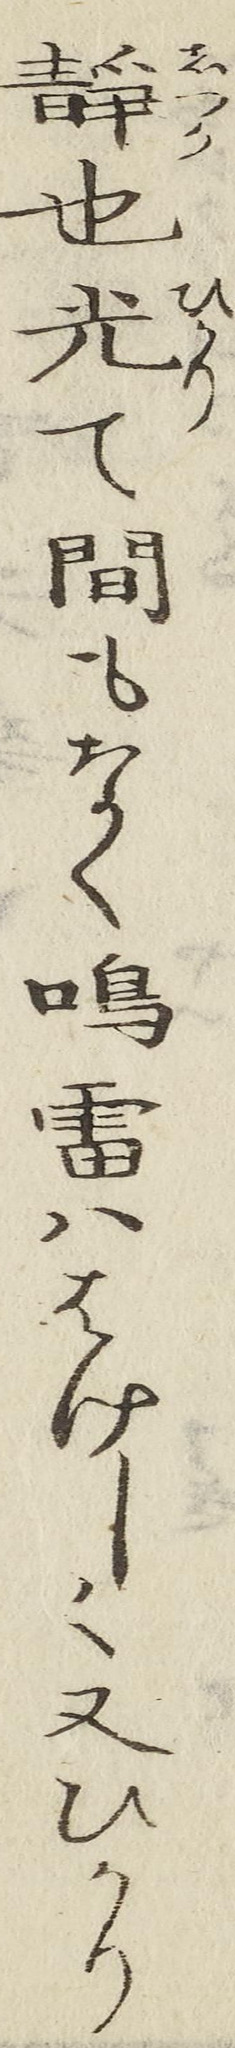静也光て間もなく鳴雷ははけしく又ひかり
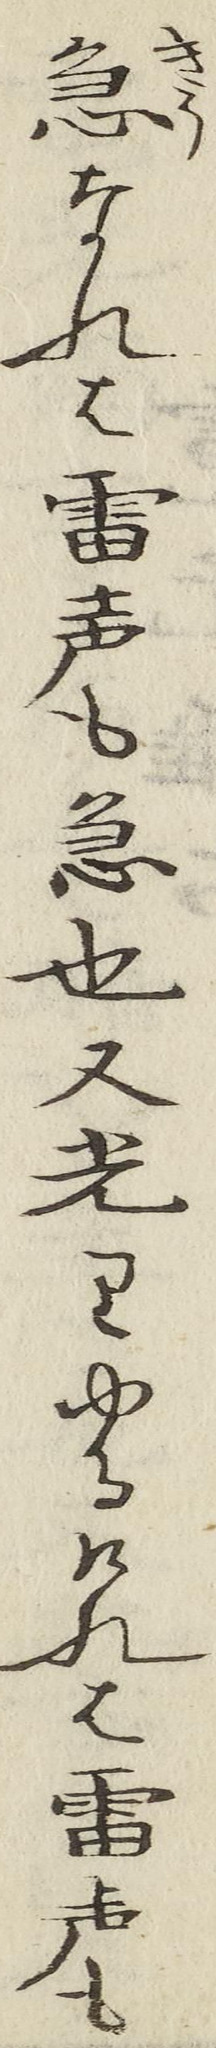急なれは雷声も急也又光りゆるけれは雷声も
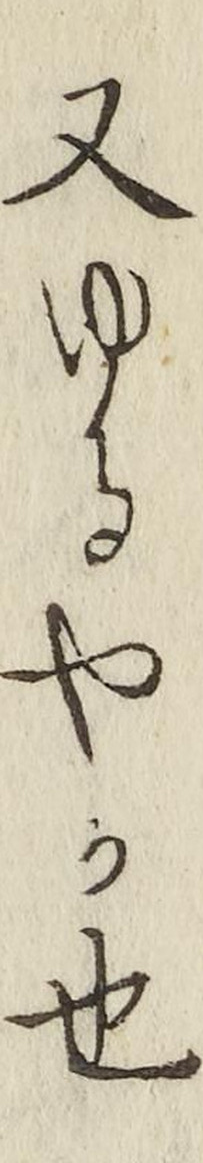又ゆるやか也
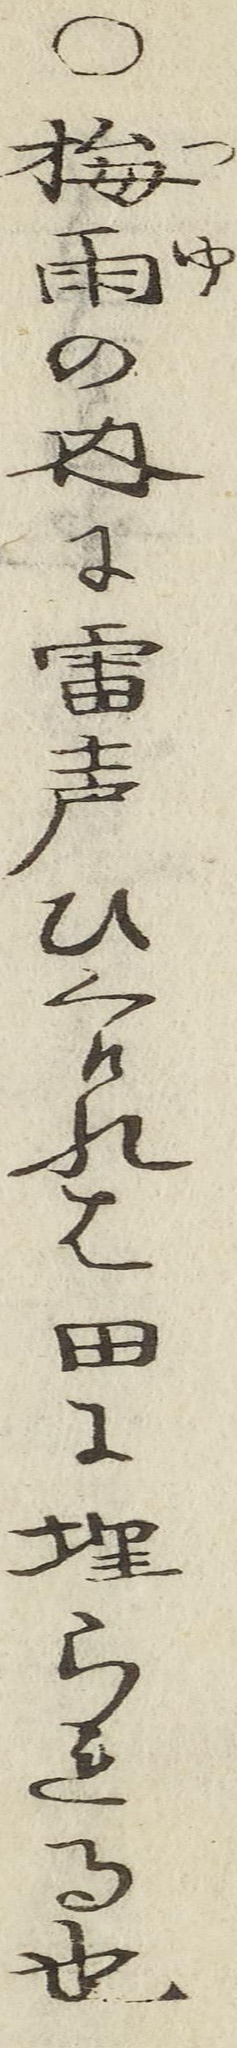○梅雨の内に雷声ひくけれは田に埋られる也
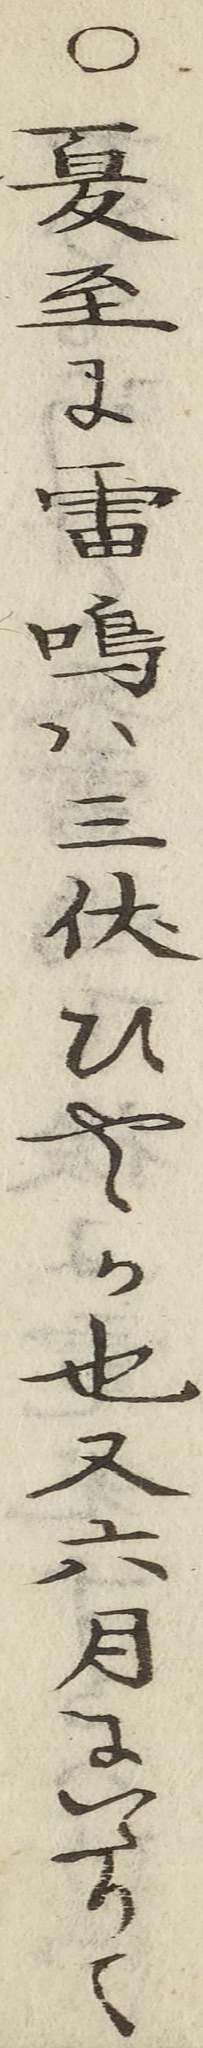○夏至に雷鳴は三伏ひやゝか也又六月にいたりて
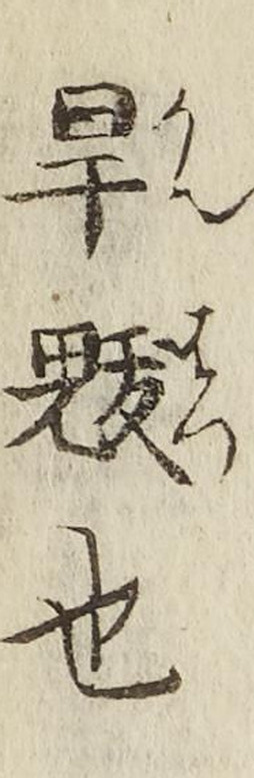旱魃也
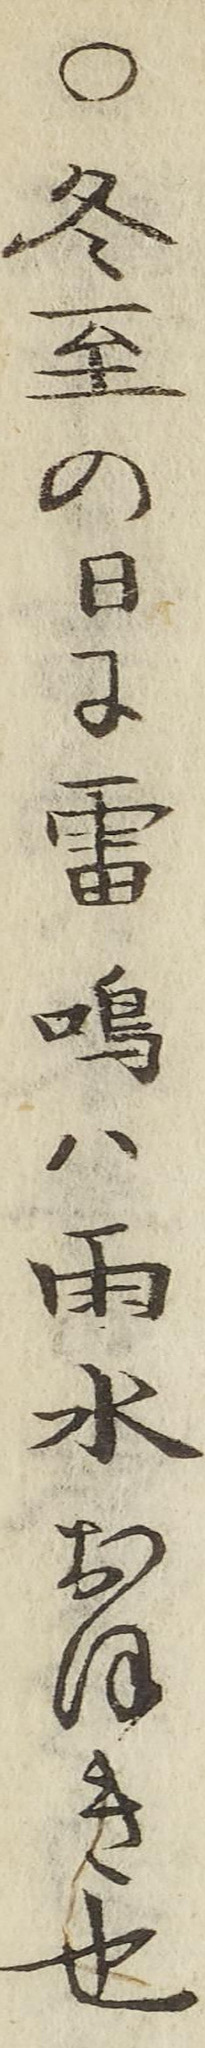○冬至の日に雷鳴は雨水おほき也

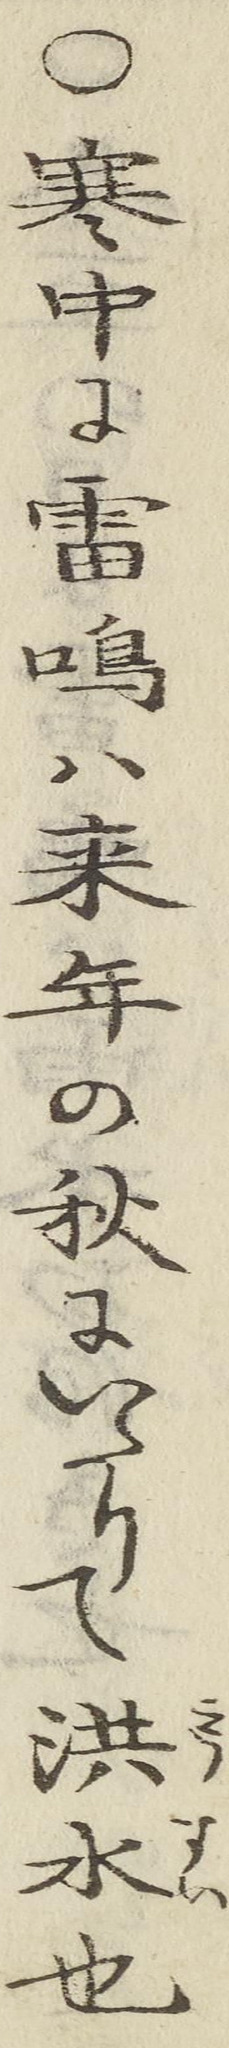○寒中に雷鳴は来年の秋にいたりて洪水也
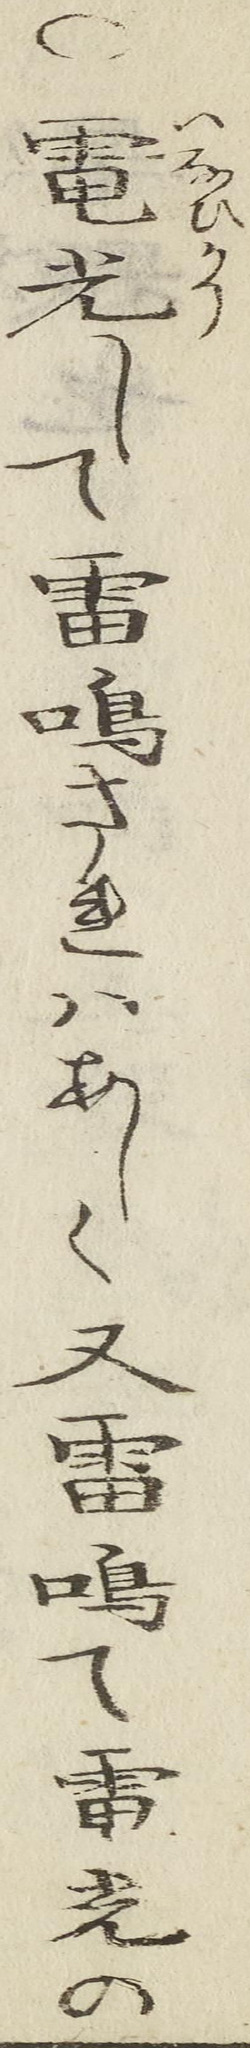○雷光して雷鳴されはあしく又雷鳴て電光の
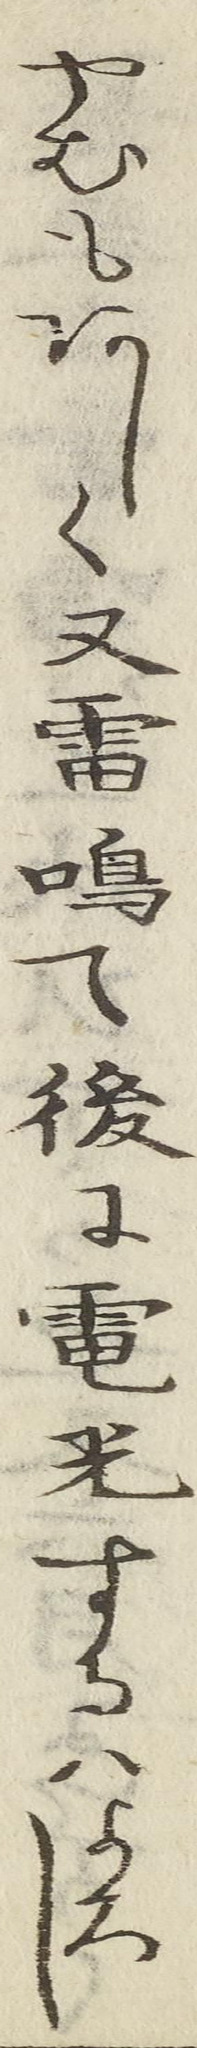やむもあしく又雷鳴て後に電光するはよろし
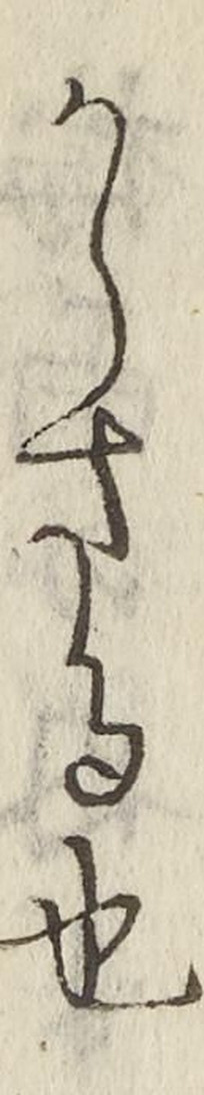からさる也
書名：天時占候　二
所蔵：東京大学地震研究所図書室 Earthquake Research Institute Library, The University of Tokyo, JAPAN
